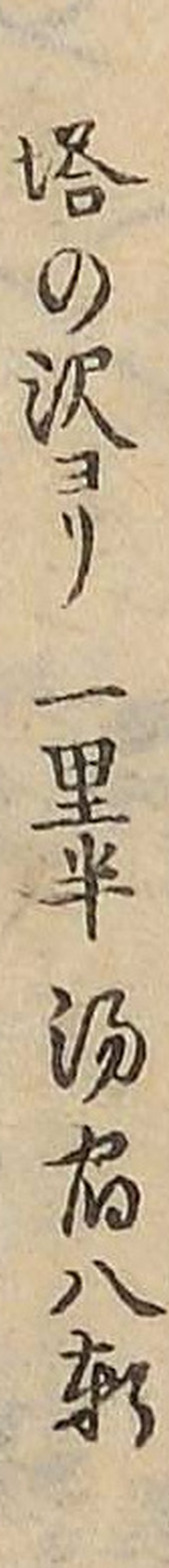宮の下塔の沢ヨリ一里半湯宿八軒
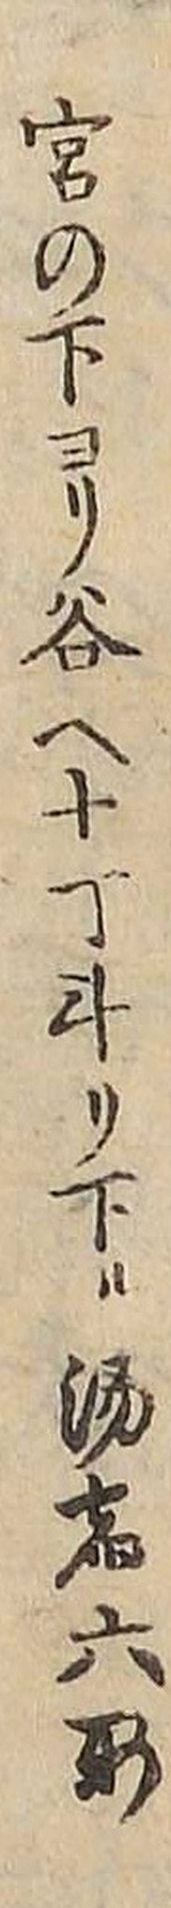堂が島宮の下ヨリ谷へ十丁計リ下ル湯宿六軒
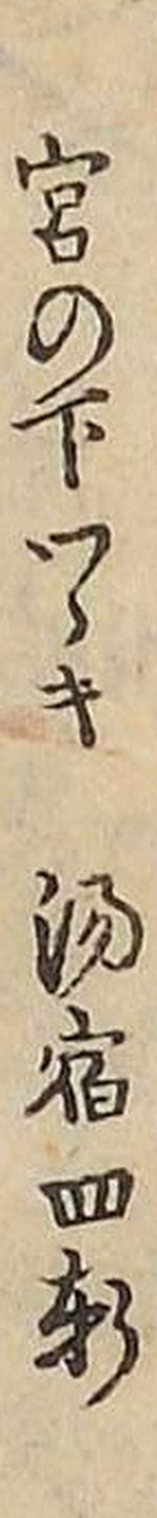底倉宮の下ツヽキ湯宿四軒
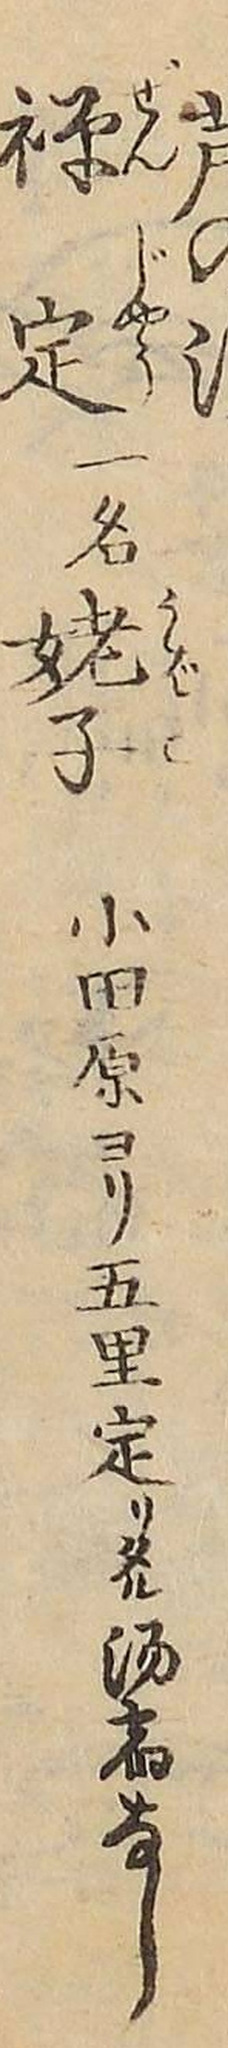禅定一名姥子小田原ヨリ五里定リタル湯宿なし
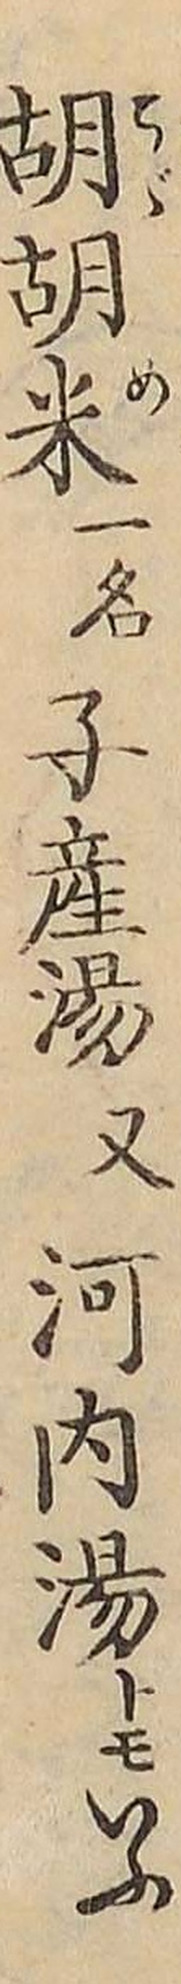胡胡米一名子産湯又河内湯トモいふ
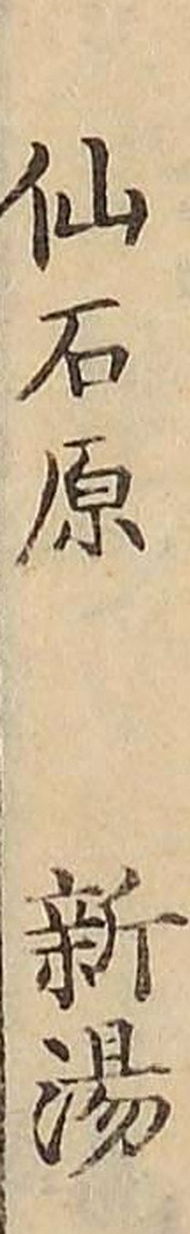仙石原新湯
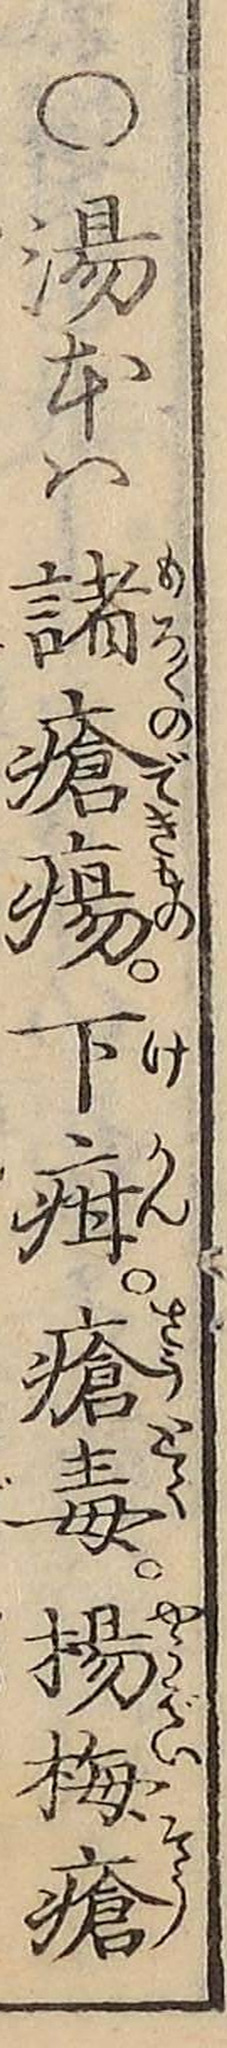○湯本は諸瘡痬。下疳。瘡毒。楊梅瘡
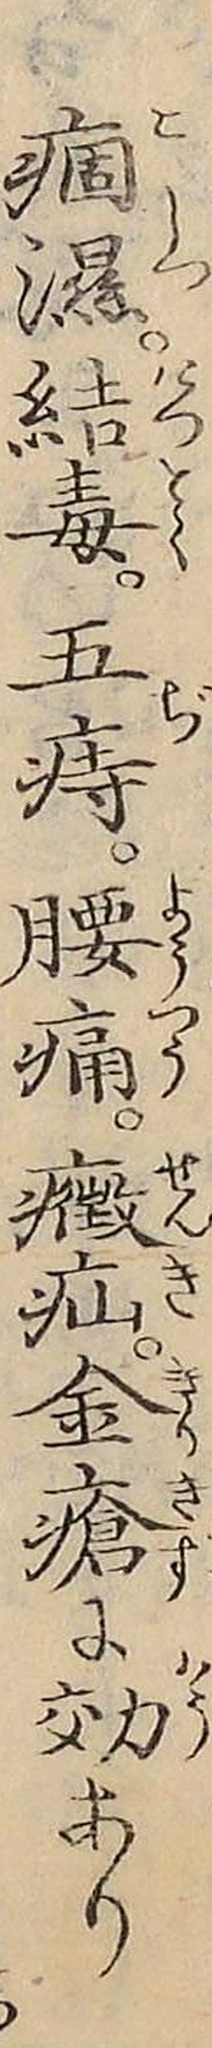痼湿。結毒。五痔。腰痛。癥疝。金瘡に効あり
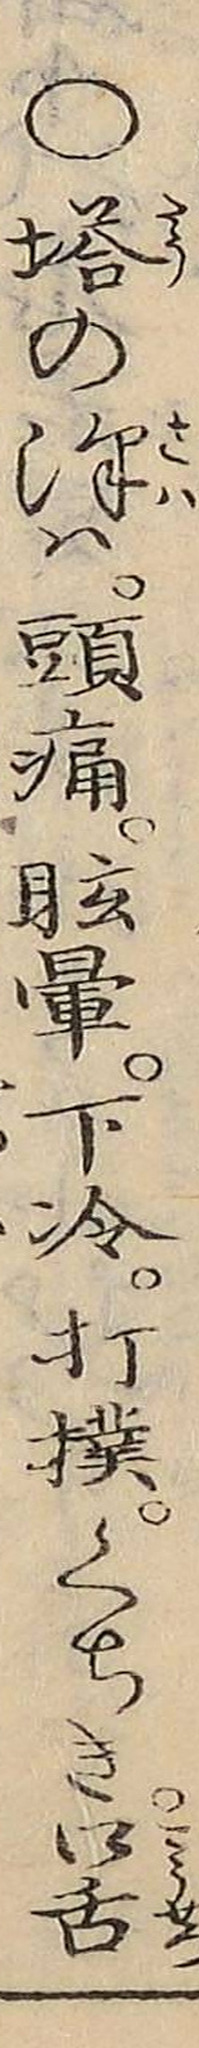○塔の沢は。頭痛。眩暈。下冷。打撲。くちき。口舌
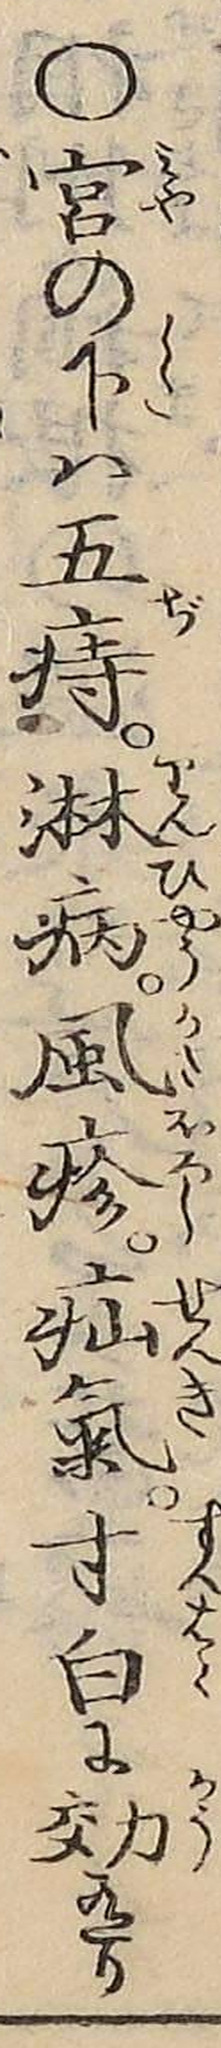○宮の下は五痔。淋病。風疹。疝気。寸白に効有り
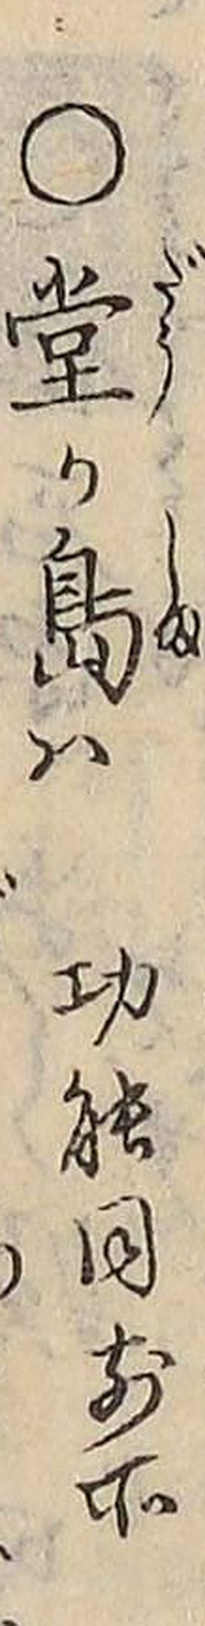○堂か島は功能同前所
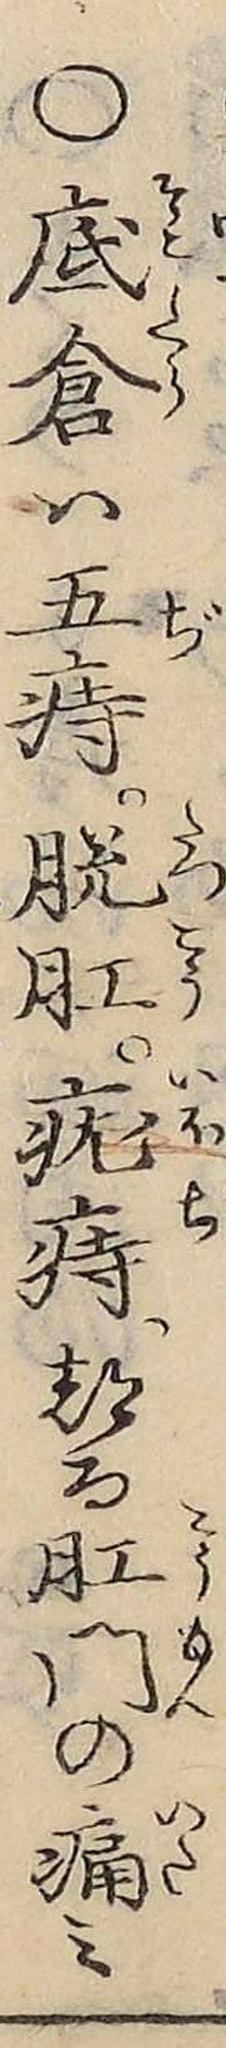○底倉は五痔。脱肛。疣痔。都而肛門の痛み
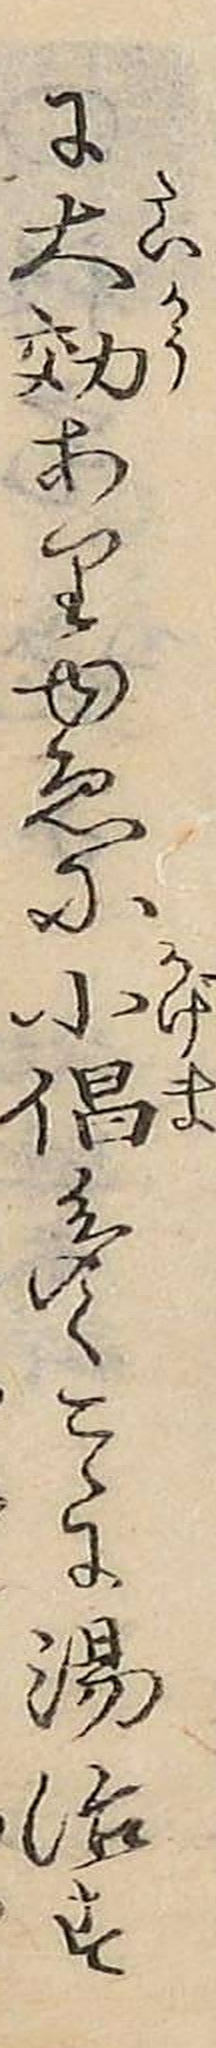に大効ありゆゑに小倡多くこゝに湯治す
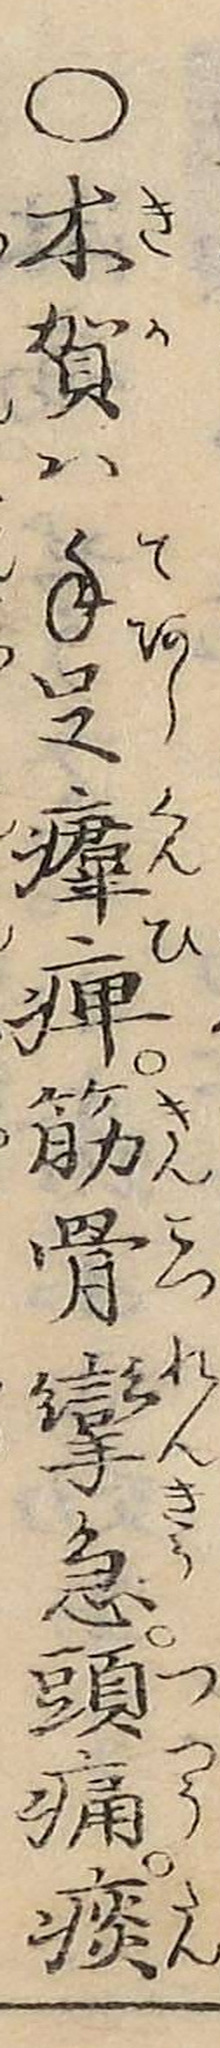○木賀は手足㿏痺。筋骨攣急。頭痛。痰
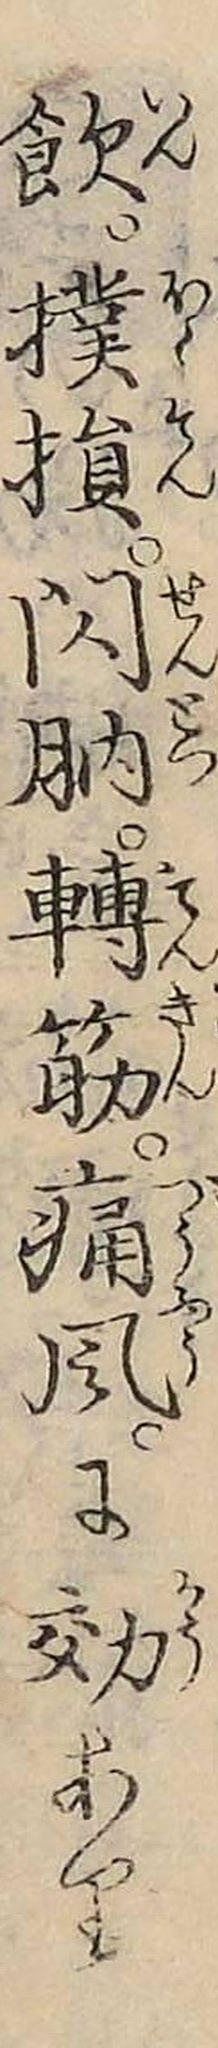飲。撲損。閃肭。転筋。痛風。に効あり

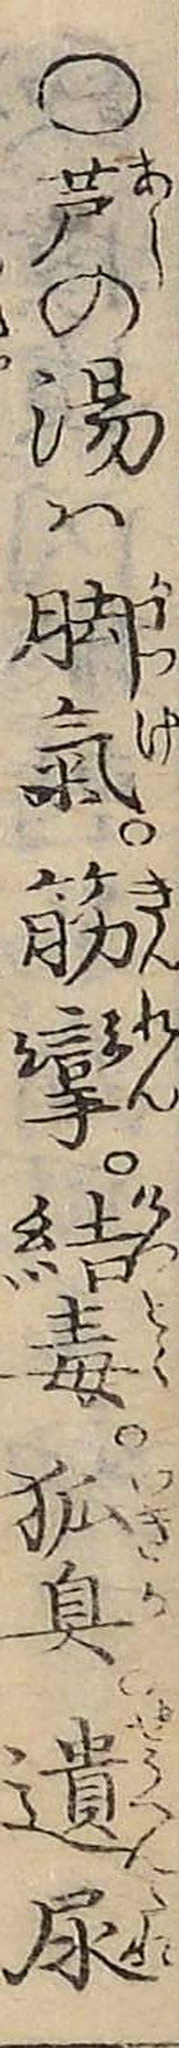○芦の湯は脚気。筋攣。結毒。狐臭。遺尿
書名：旅行用心集
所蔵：神戸大学附属図書館 国文学研究資料館
